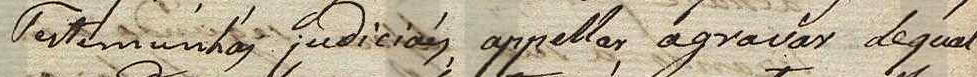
Testemunhas judiciaes, appellar, agravar, de qual
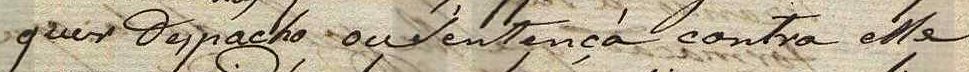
quer Despacho ou Sentença contra elle
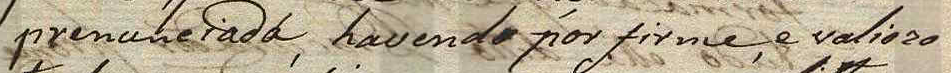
prenunciada, havendo por firme, e valiozo
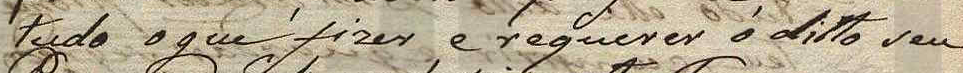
tudo o que fizer, e requerer o ditto seu
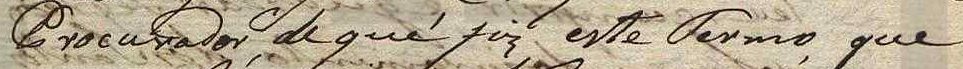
Procurador, de que fiz este Termo, que
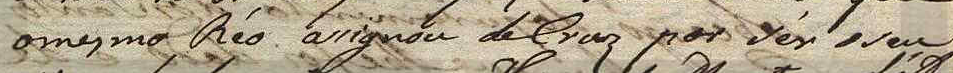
o mesmo Reo assignou de Cruz por ser o seu
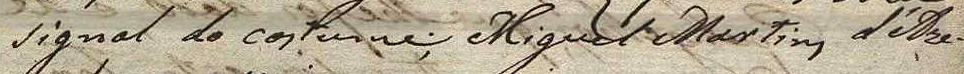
signal do costume; Miguel Martins d'Aze
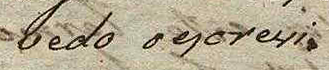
vedo o escrevi.
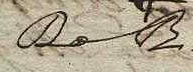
Do R.
